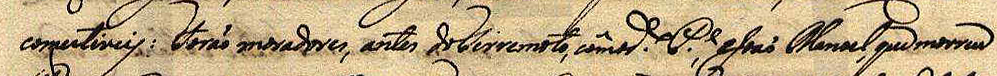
comestiveis: Foraõ moradores, antes do Terremoto, com o d.o P.e, e Joaõ Manoel, que morreu
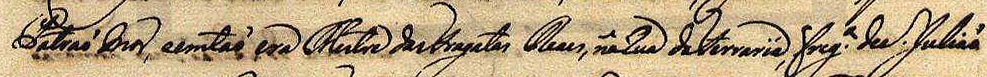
Patraõ mor, e emtaõ era Mestre das Fragatas Reaes, na Rua de Ferraria, freg.a de S. Juliaõ
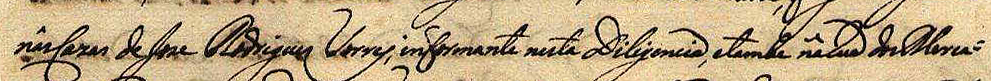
nas Cazas de Joze Rodriguez Torres, informante nesta Diligencia, e tambe na Rua do Merca
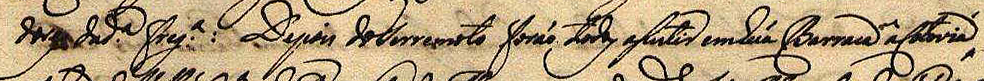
dores da d.a freg.a: Depois do Terremoto foraõ todos asistir em huā Barraca a Cotovia
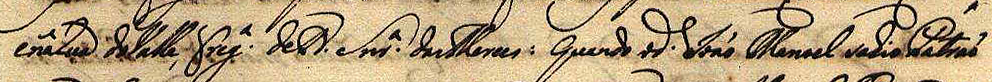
e na Rua do Valle, freg.a de N. Snr. das Merces: Quando o d.o Ioaõ Manoel sahio Patraõ
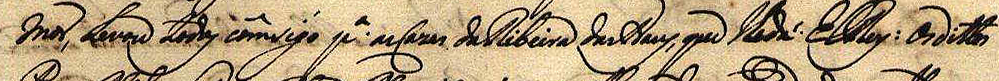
mor, Levou todos comsigo p.a as Cazas da Ribeira das Naus, que lhe dá El Rey: os dittos
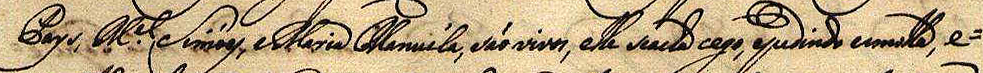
Pays, M.el Simoes, e Maria Manuela, saõ vivos, elle se acha cego, e pedindo esmolla, e
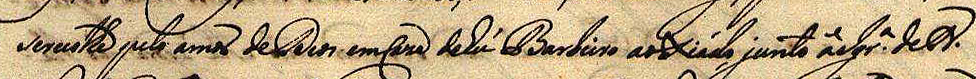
seruelhe pelo amor de Deos em Caza de hū Barbeiro ao Xiádo junto a Igr.a de N.
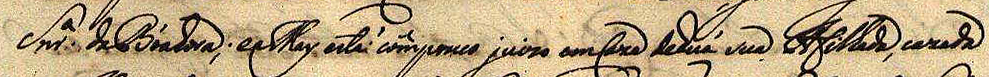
Snr.a da Bóa hora; e a May está com pouco juizo em Caza de huā sua Afilhada, cazada
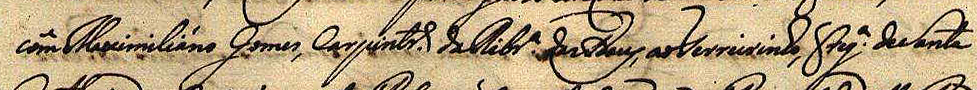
com Maximiliáno Gomes, Carpintr.o da Ribr.a das Naus, ao Ferreirinho, frg.a de Santa
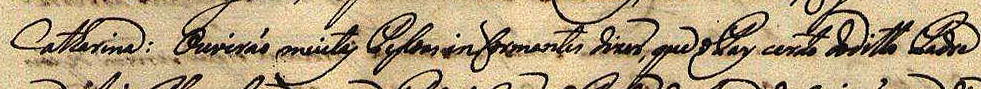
Catharina: Ouviraõ muitas Pessoas informantes dizer, que o Pay certo do ditto Padre
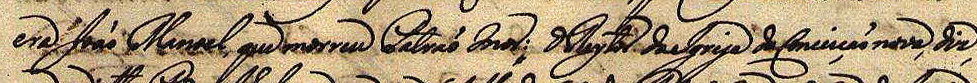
era Joaõ Manoel, que morreu Patraõ mor; O Reytor da Igreja de Conceiçaõ nova, diz
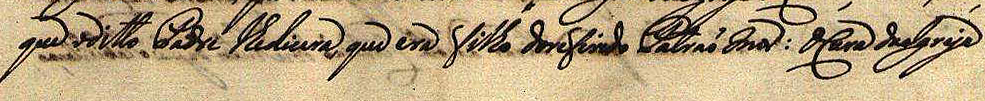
que o ditto Padre lhe dicera, que era filho do referido Patraõ mor: O Cura da Igreja
